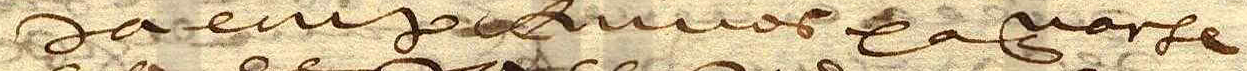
ta e oito Annos paguarse
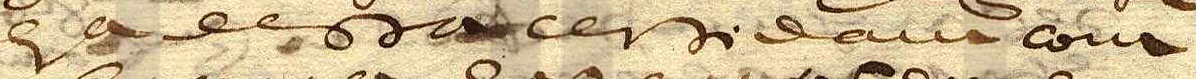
ha desta certidam com
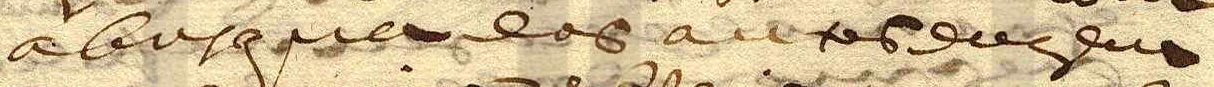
a busqua dos autos duzem
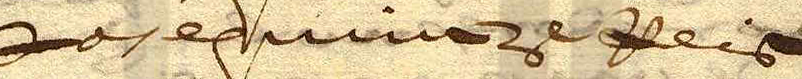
tos e quimze Reis
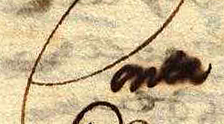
Conta
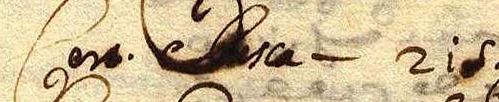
Cert. e busca - 215
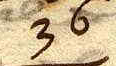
36
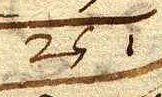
251
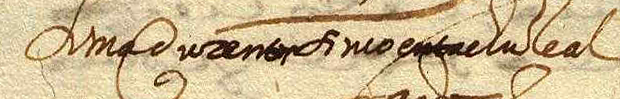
Soma duzentos sincoenta e hū Real
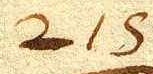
2i5
